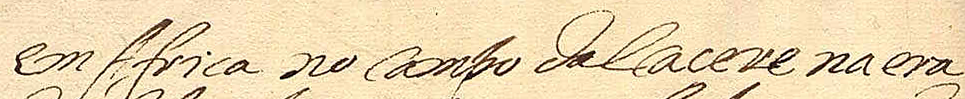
Em Africa no campo dalcacere na era
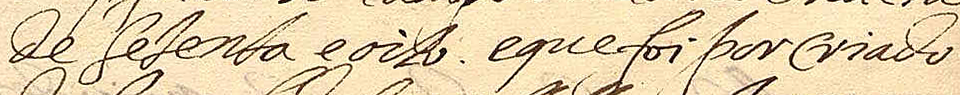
de setenta e oito. e que foi por criado
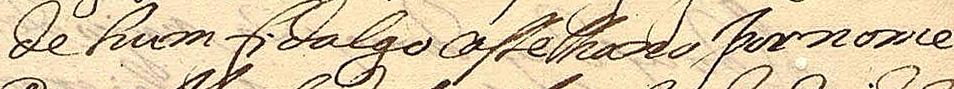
de hum fidalgo castelhano, por nome
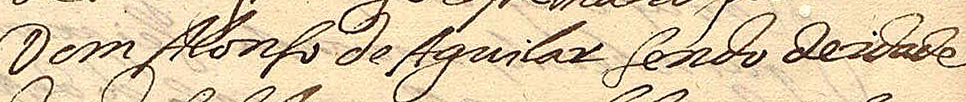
Dom Alonso de Aguilar sendo de idade
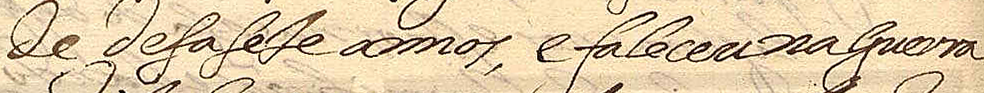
de desasete annos, e faleceu na Guerra
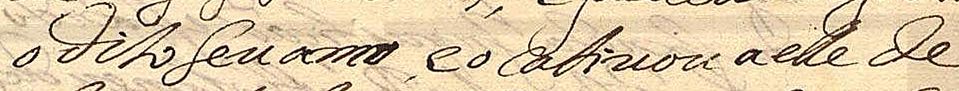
o dito seu amo, e o catiuou a elle de
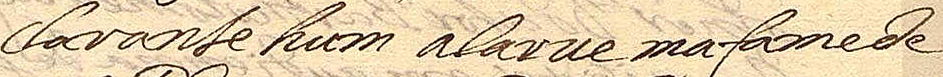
clarante hum alarue mafamede
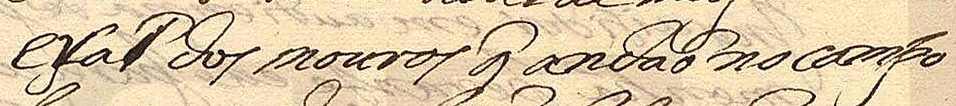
era dos mouros q̄ andaõ no campo
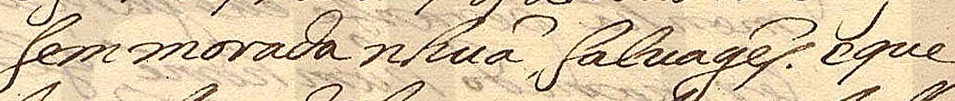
sem morada nhuā, saluagēs. e que
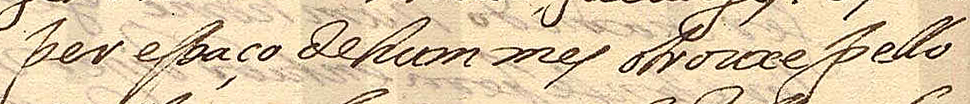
per espaço de hum mes o trouxe pello
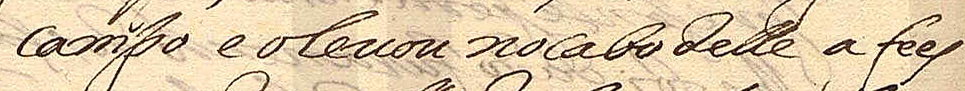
campo e o leuou no cabo delle a fees
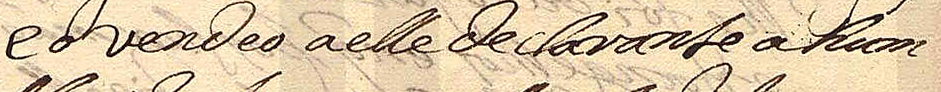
e o vendeo a elle declarante a hum
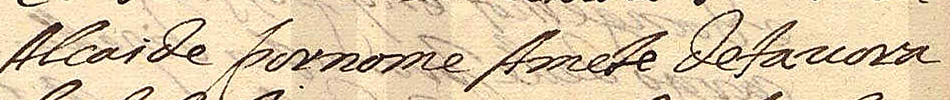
Alcaide por nome Amete de tauora
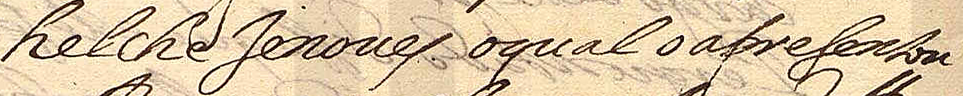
helche Jenoues o qual o apresentou
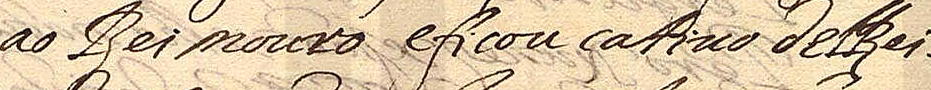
ao Rei mouro e ficou catiuo del Rei
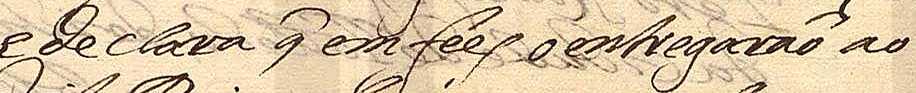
E declara q̄ em fees o entregaraõ ao
